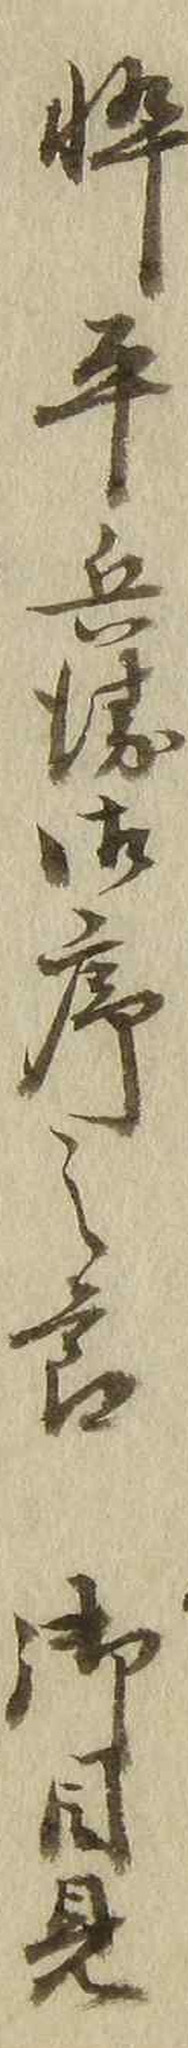忰平兵衛御序之節御目見
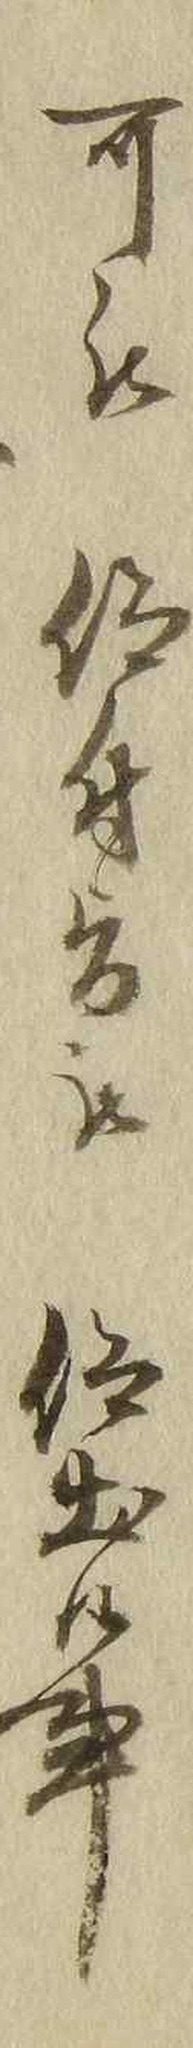可被仰付旨被仰出候事
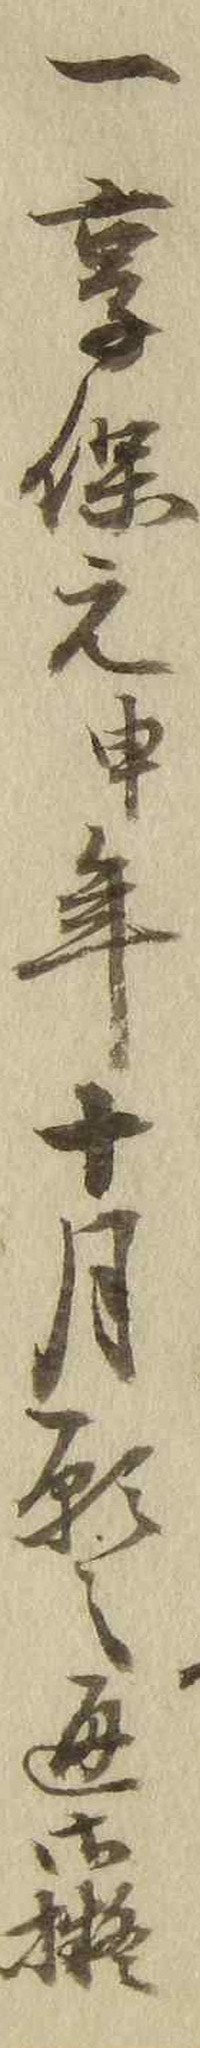一享保元申年十月願之通御擬

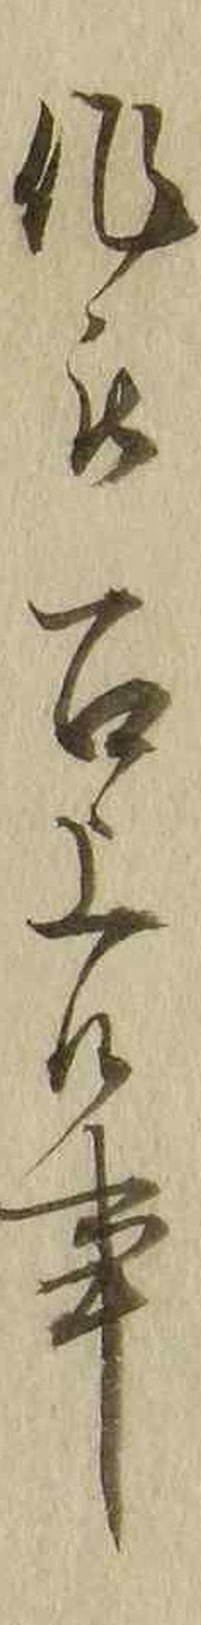作被召上候事
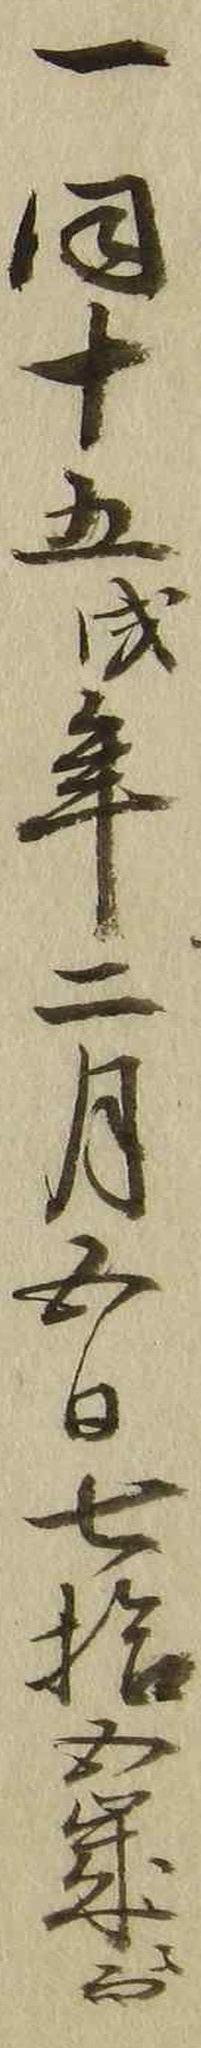一同十五戌年二月五日七拾五歳ニ而
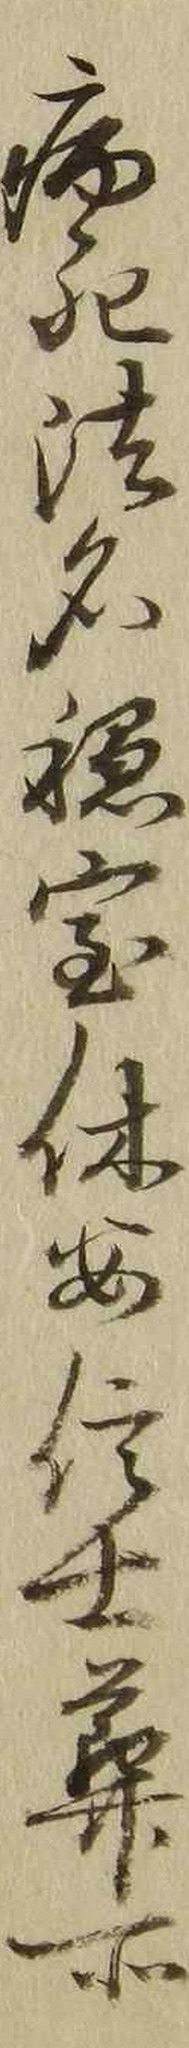病死法名穏室休安信士葬所
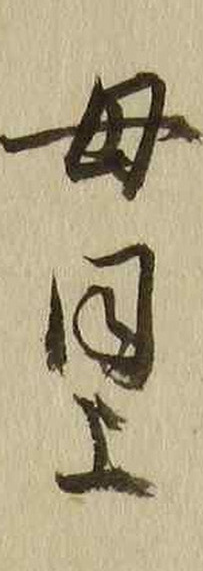母同上
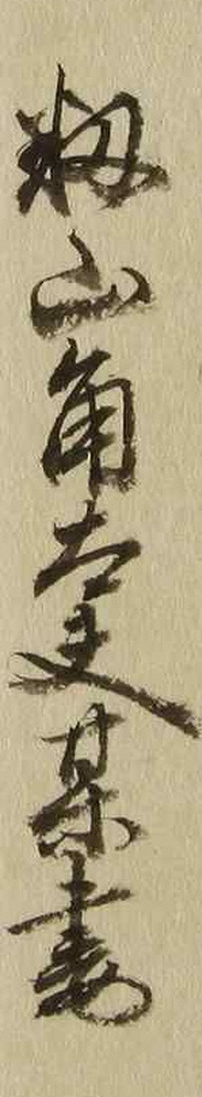女籾山角太夫某妻
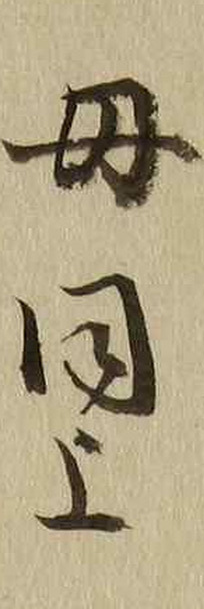母同上
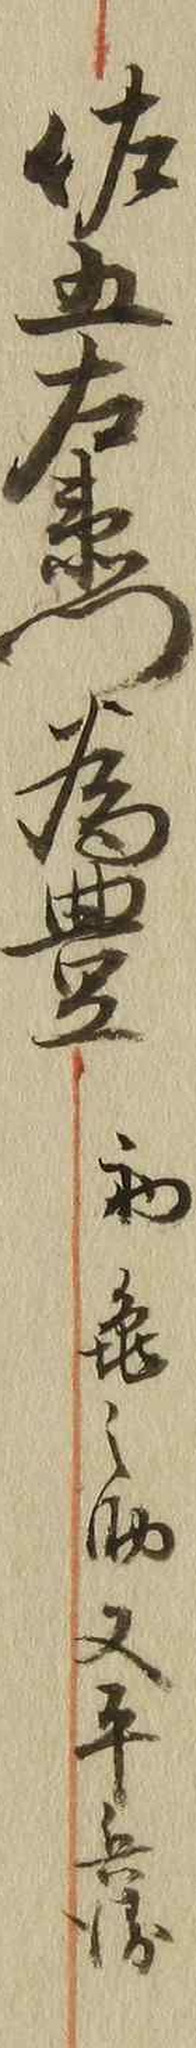佐五左衛門為豊初亀之助又平兵衛
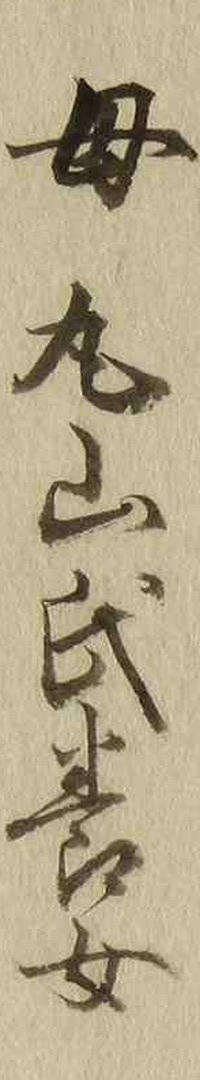母丸山氏養女

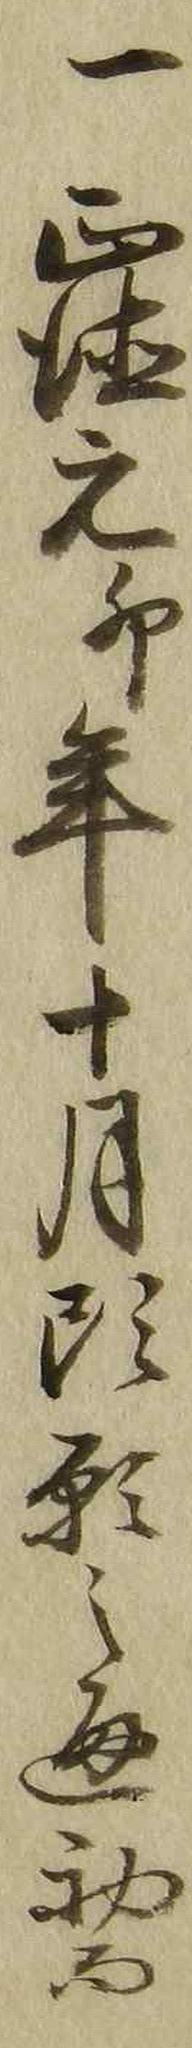一正徳元卯年十月頭願之通初而
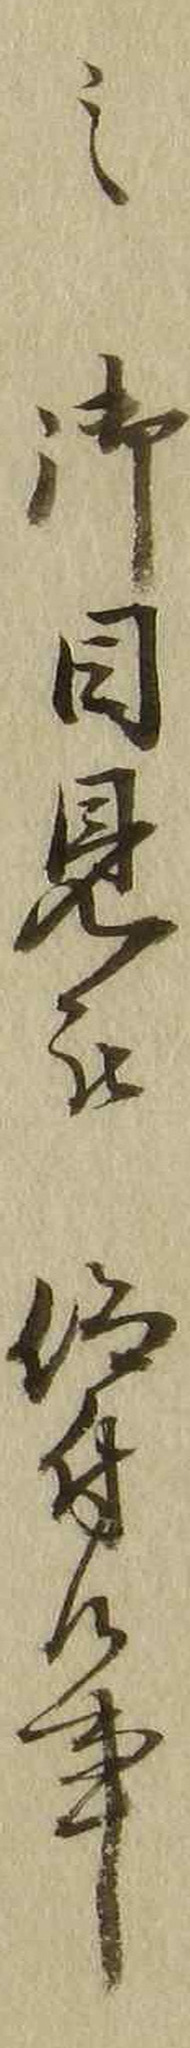之御目見被仰付候事
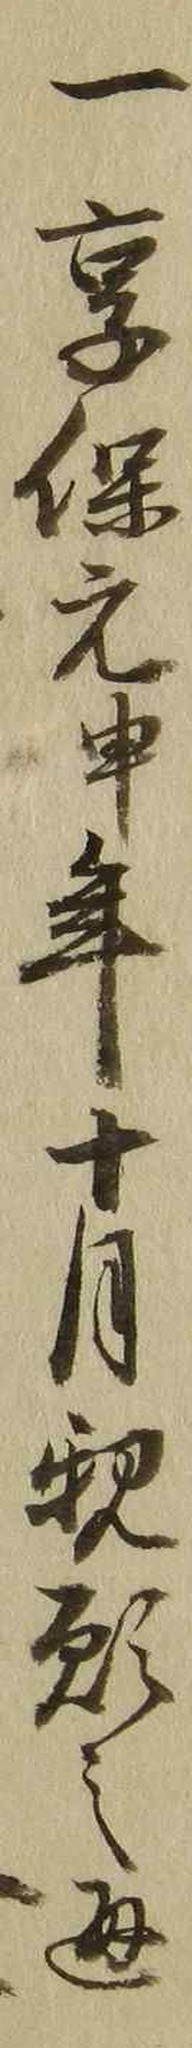一享保元申年十月親願之通
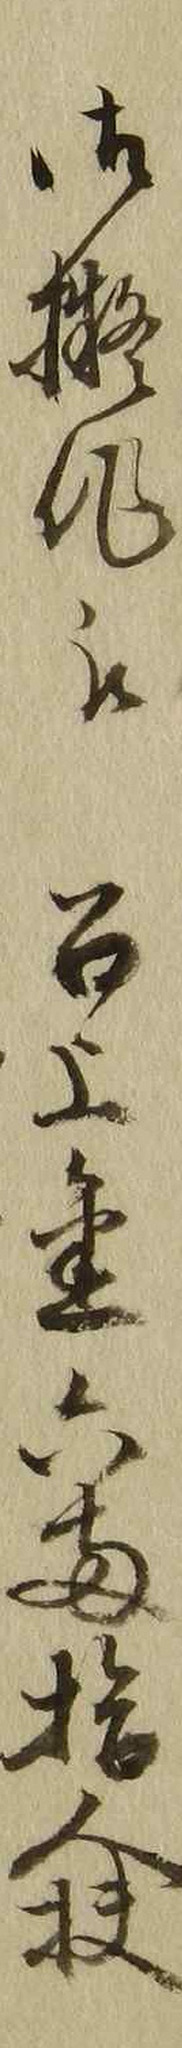御擬作被召上金六両拾人扶
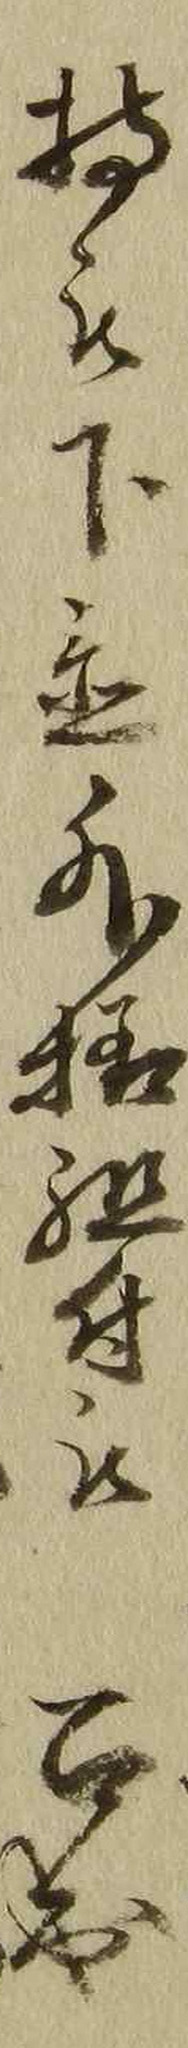持被下置外様組付被召出
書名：諸士系譜　巻之64　と之部7
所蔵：会津若松市立会津図書館
